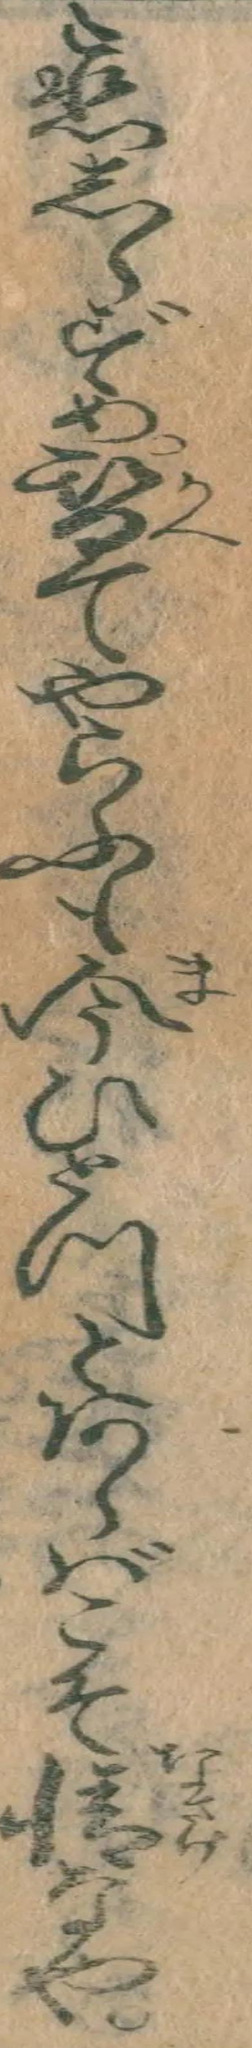恋しらずめ。替てやらふも今ひとつとあらばこそ情なや。
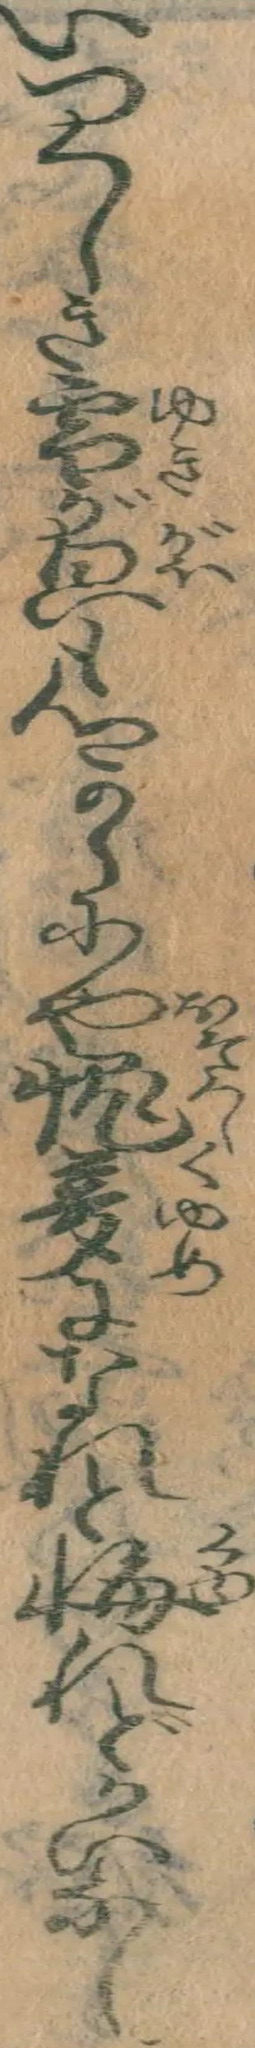いつくしき雪が貌も心からにや恐夢になれと悔れどかいなし。
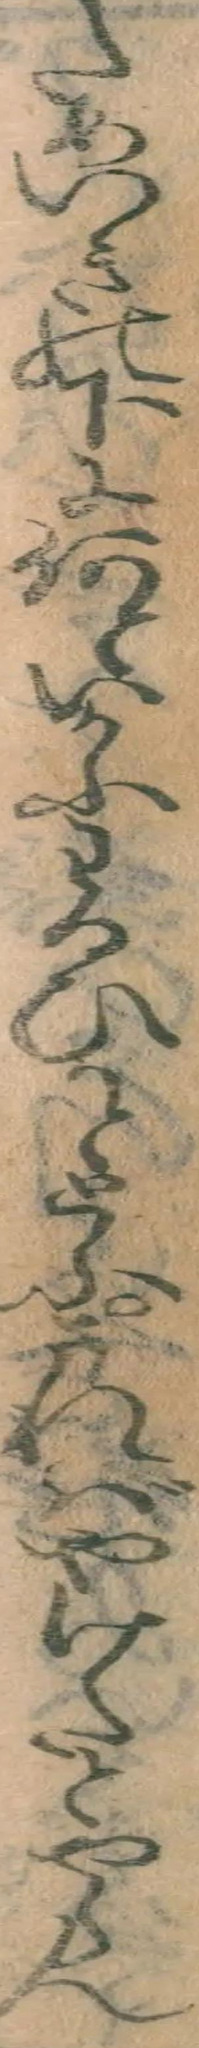ためいきの下に何といかふわるひかととふ。さればやけたとやらん
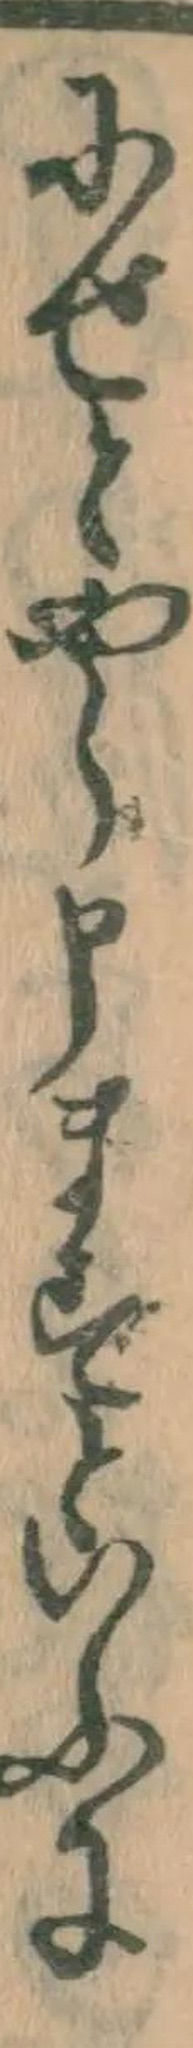にせとやら申ますといふに
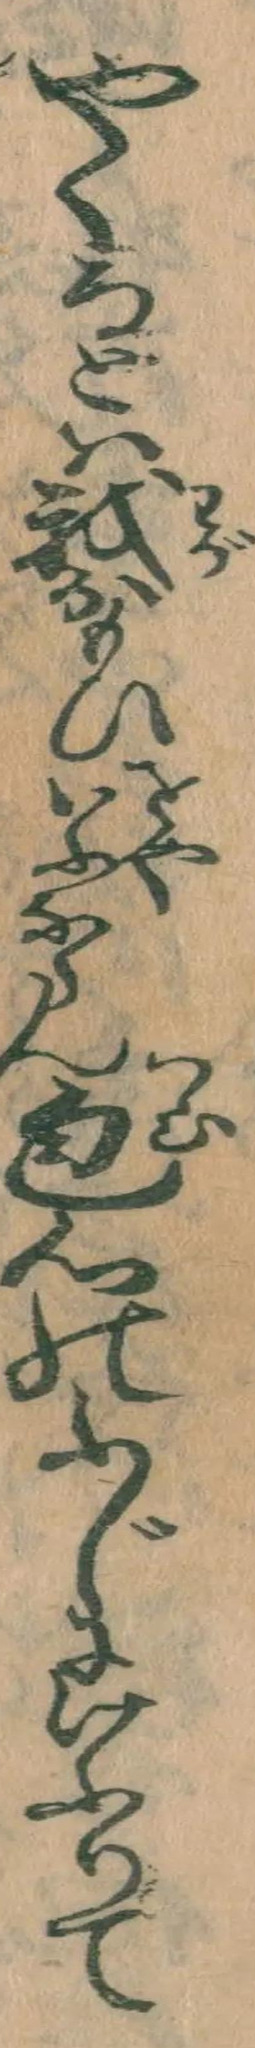やくるとは我おもひをやいふならん包心のふじにけふりて
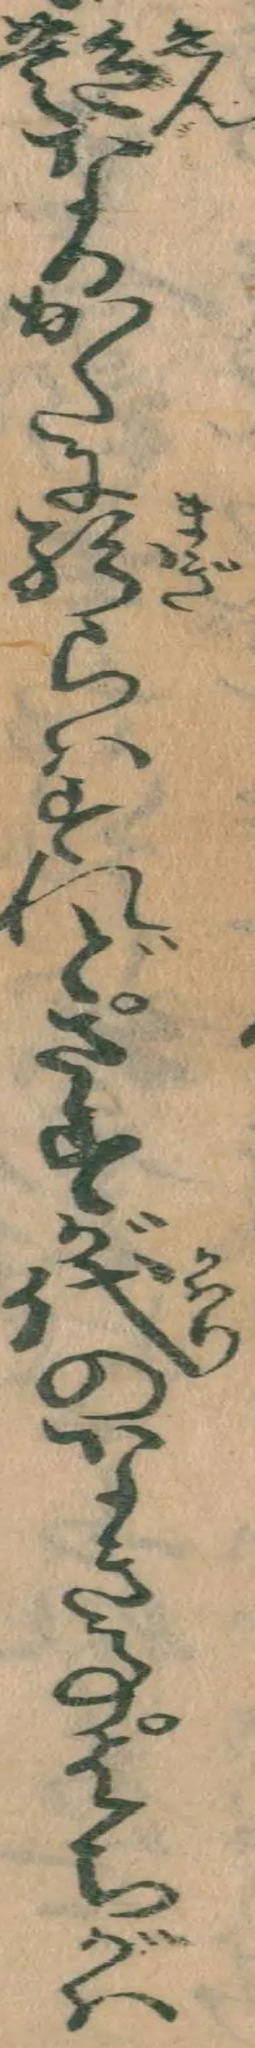と艶なるかたに紛らはすれど。さすが代のなき事。はちがは
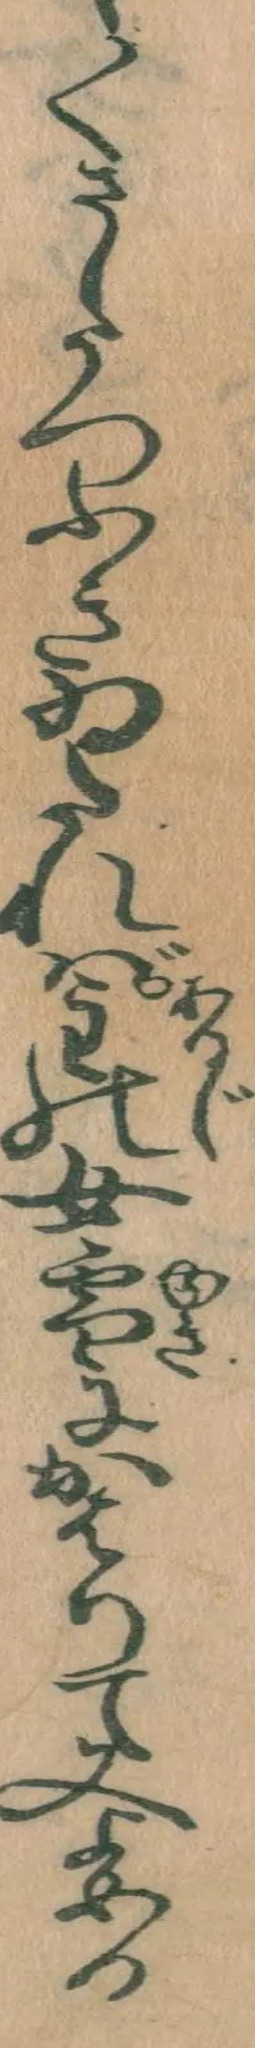しくさしうつふきゐたれば。主の女雪にかはりて又よめる
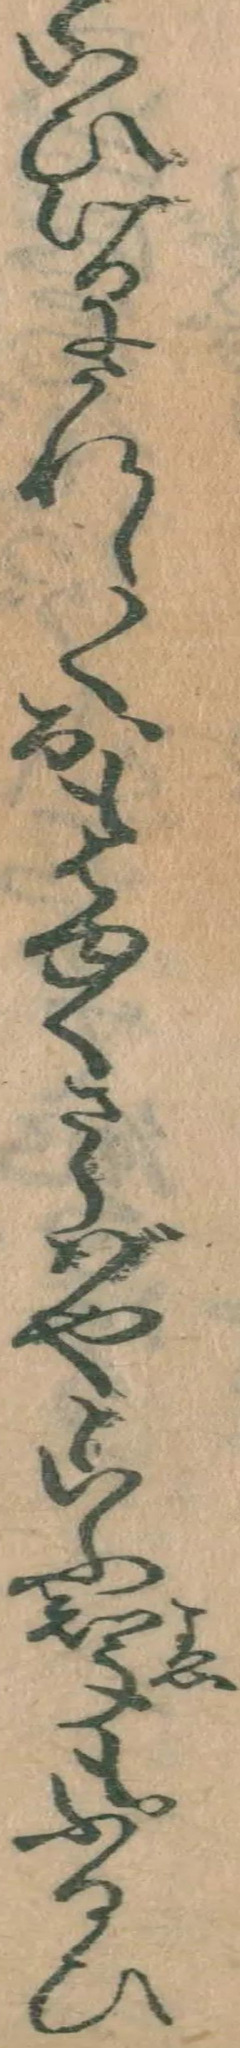といひけるにうれし〱おもはゆくさらばやといふ声も。ふるひ
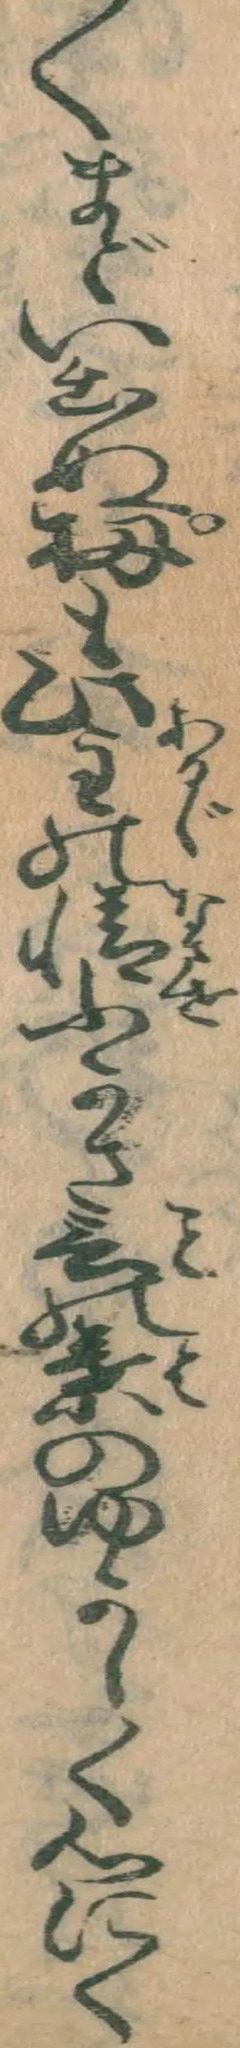〳〵まどい出ぬ。扨も此主の情ふかさ言の葉のゆかしく心にく
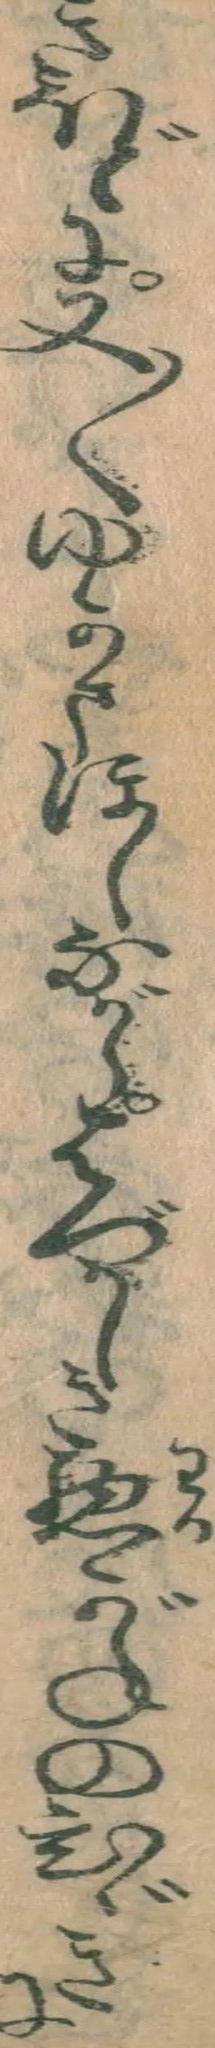きほどに。又々ゆかまほしながら。はづかしき悪がねのひゞき
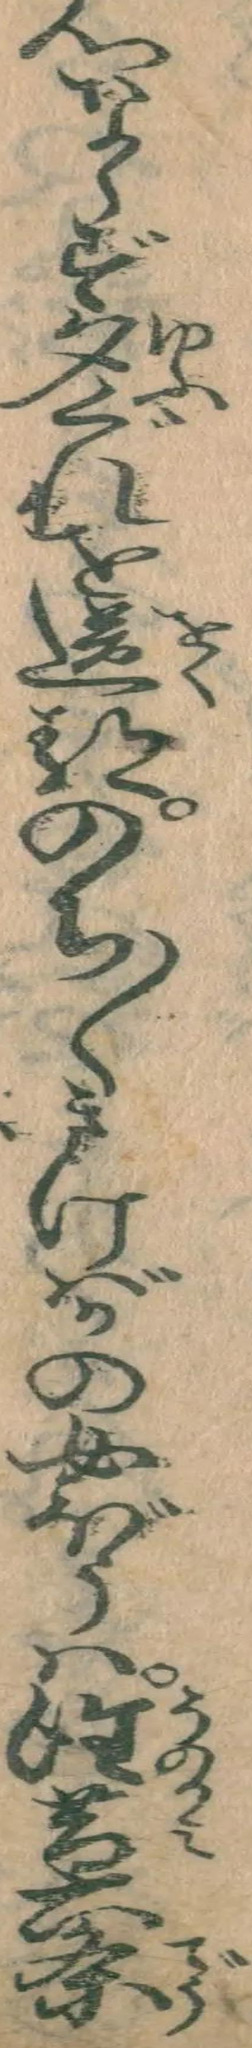心ならず夕ぐれを送る。のち〳〵きけばかの女ぼうは。往昔六条
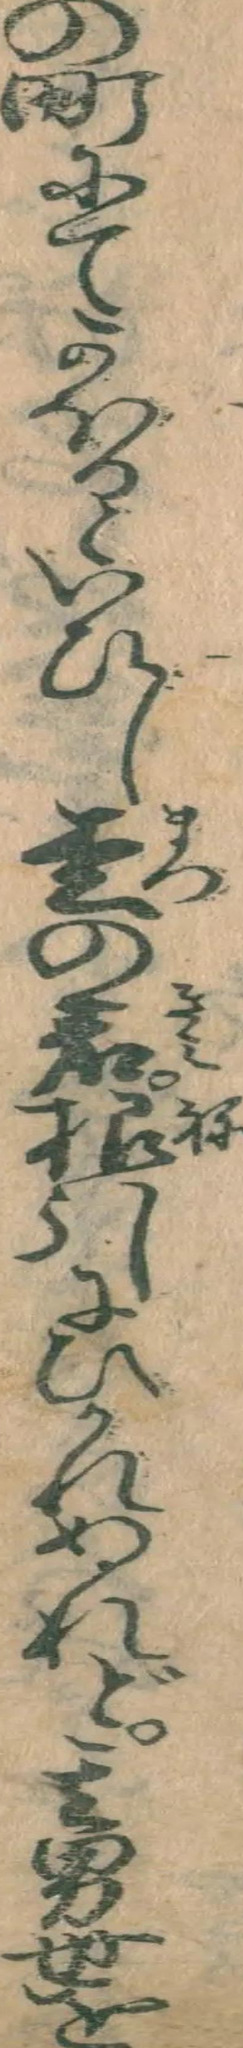の町にてかほるといひし松の君。根引にひかれぬれど。其男世を
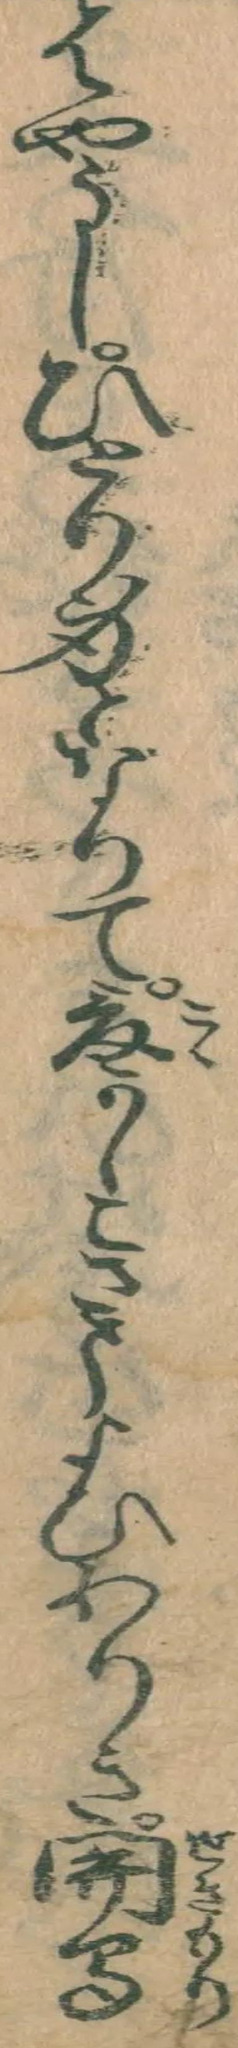はやうし。ひとり身となりて。爰かしこさまよひありき。関守

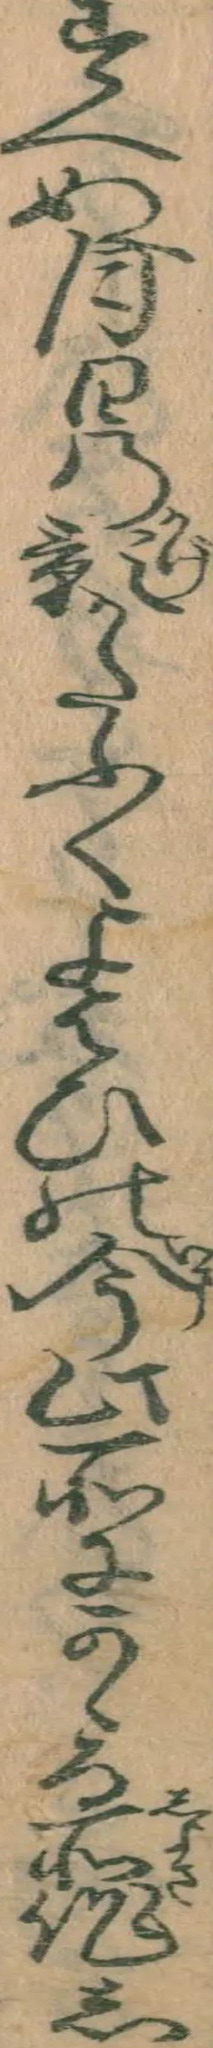すへぬ月日の影かたふくよはひの今此一所にかゝる所作し
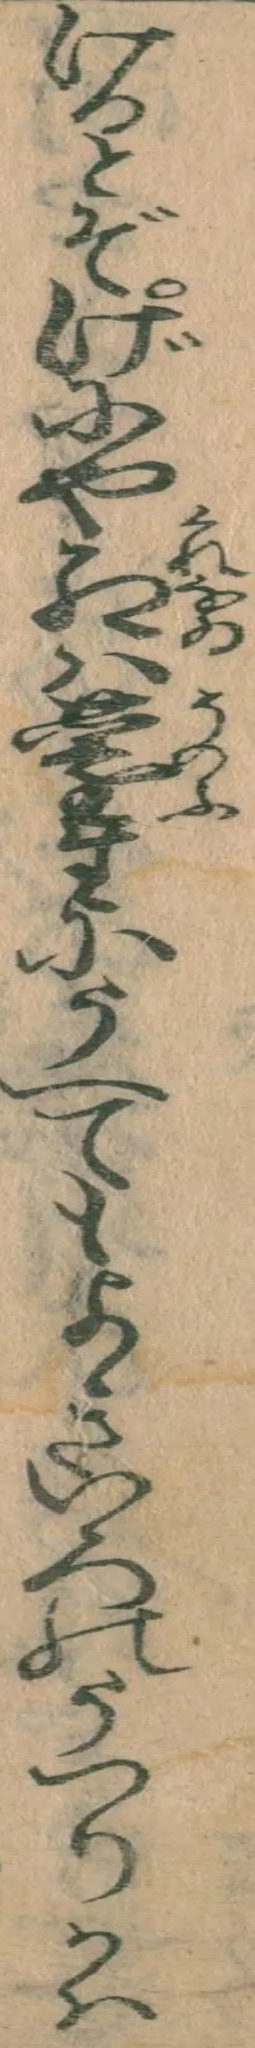けるとぞ。げにや紅は園生にうへてもよきいろのうつりかは
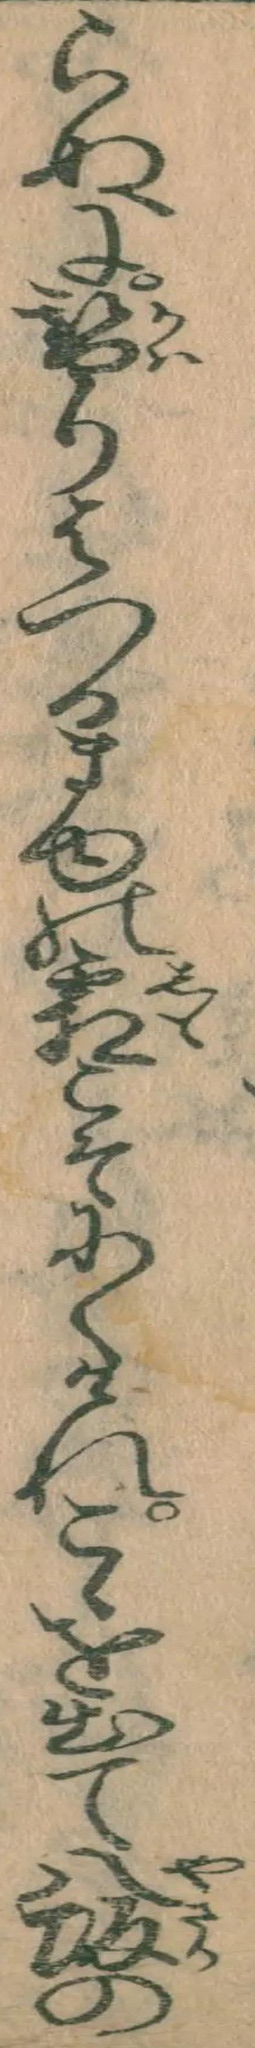らぬに。替りはつるまゆの霜こそにくけれ。こゝを出て八坂の
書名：新竹斎 5巻
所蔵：国立国会図書館 National Diet Library, JAPAN
